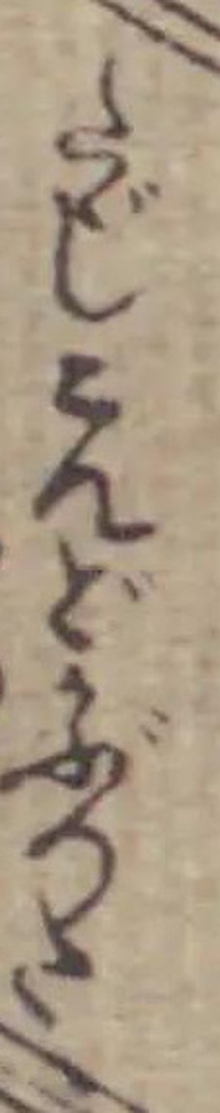たゞしこんどかぶつた
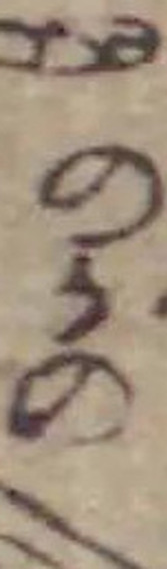のかの
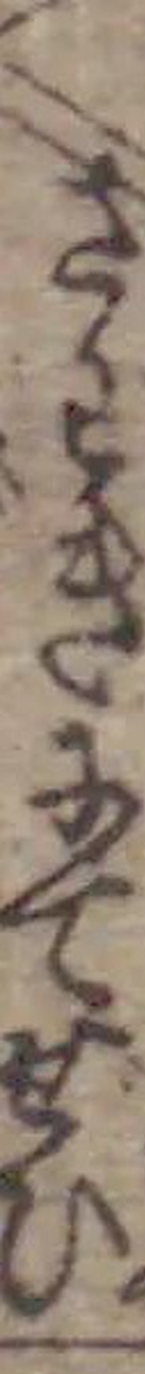さわきにてぜひ
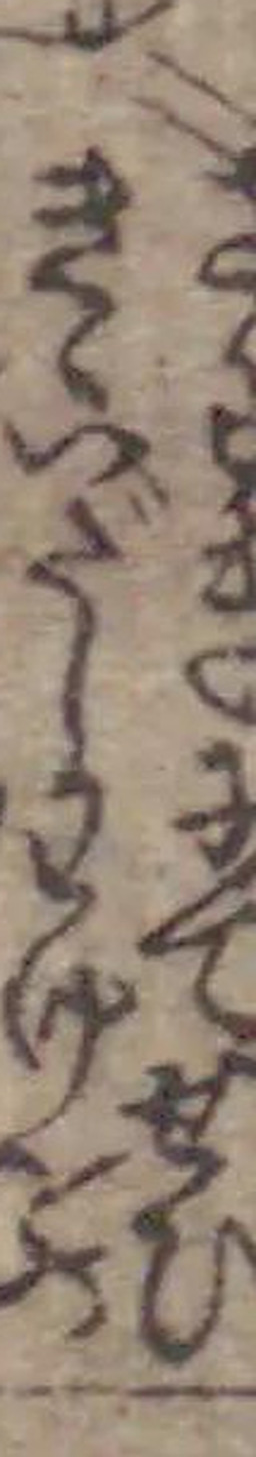きゝいだしわけをつ
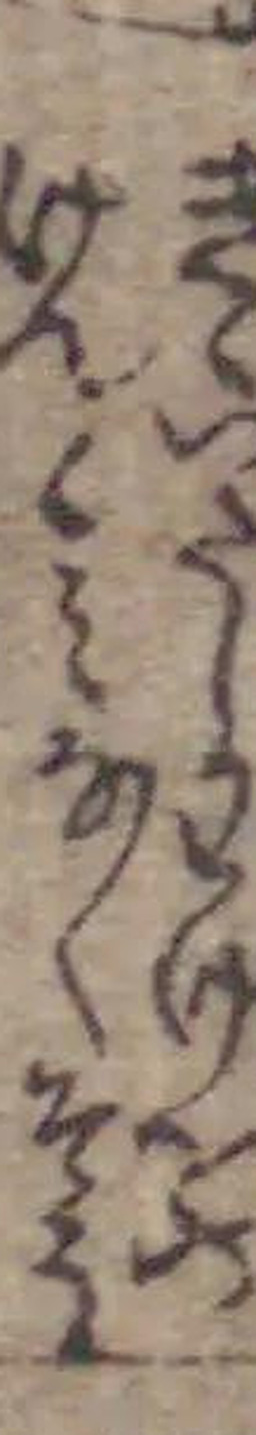けんとみな〳〵そう

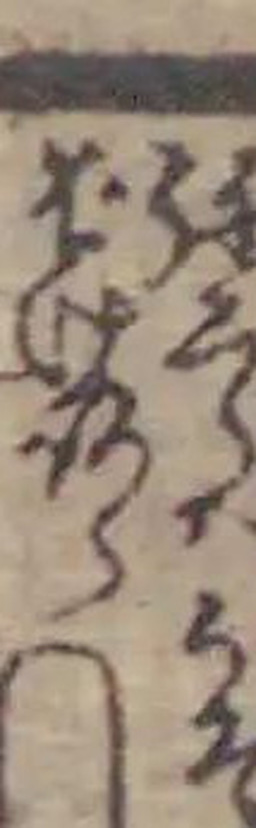ばけあら
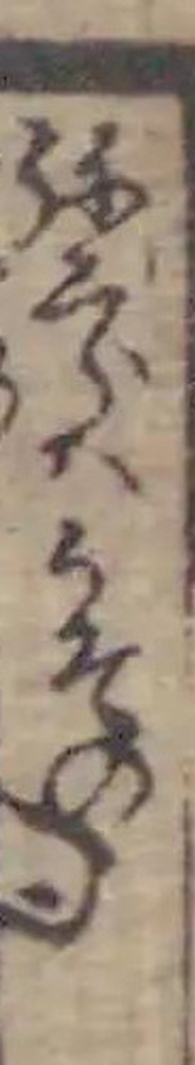弥二郎はうその
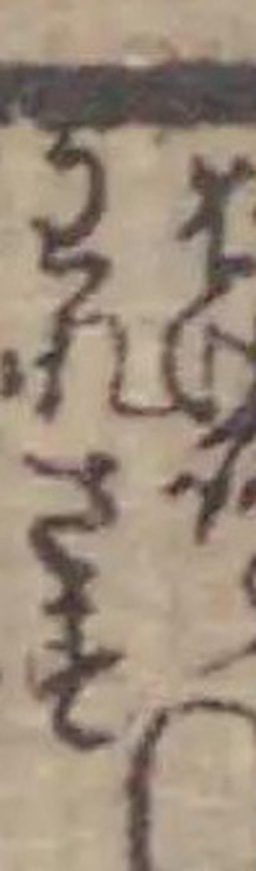われさす
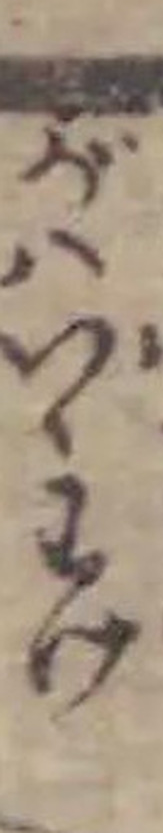がはいゝわけ
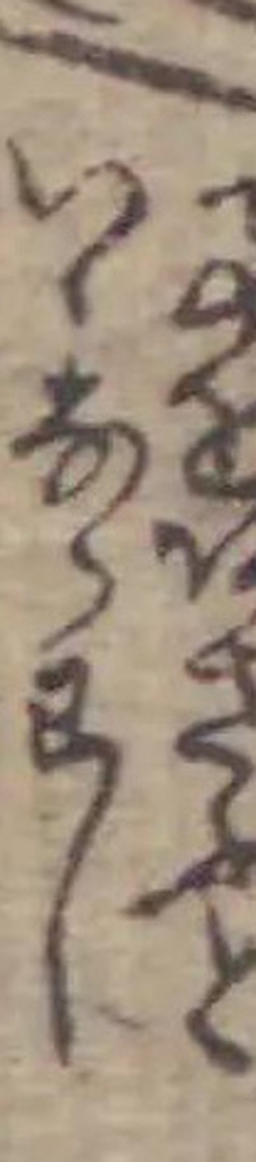いゝならわし
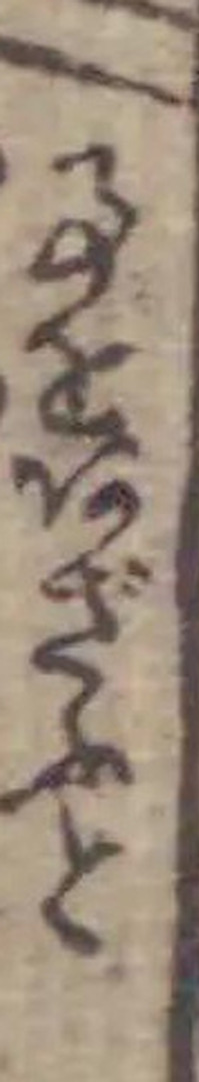事をあざふと
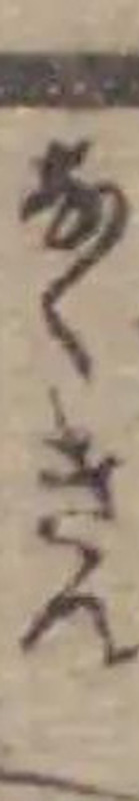なくきん
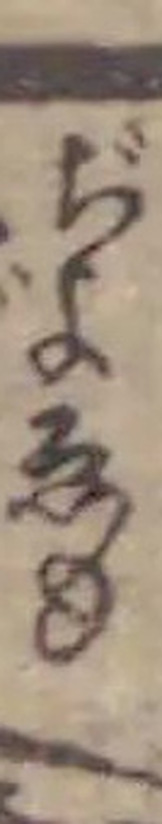じよゑも
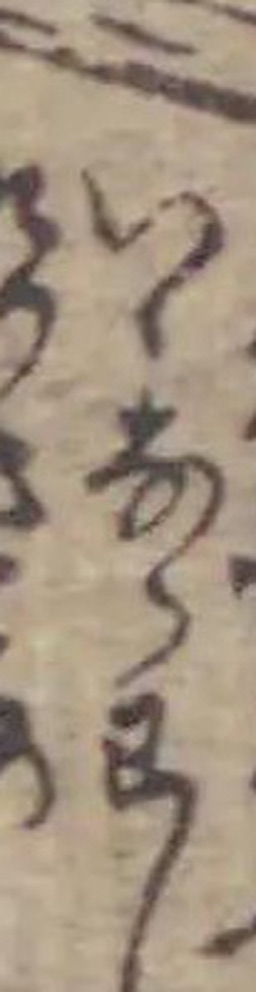けりさとの
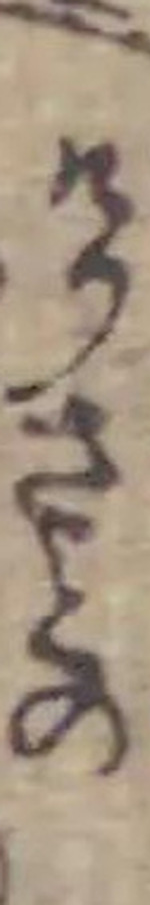けりさとの
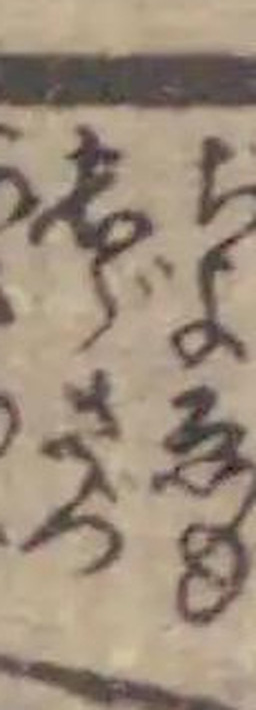しらさづ
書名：虚言弥二郎傾城誠 3巻
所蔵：国立国会図書館 National Diet Library, JAPAN
